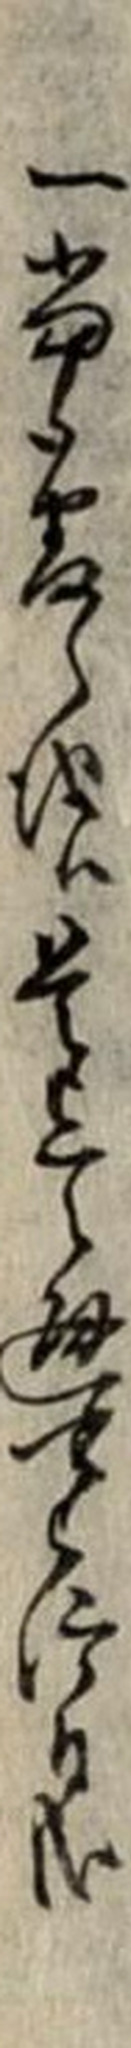一当番之儀は是迄之通可被仰付哉
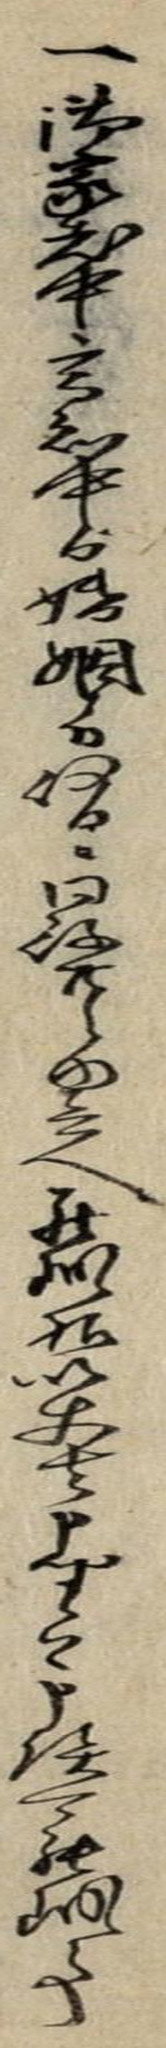一御家老中高知中ゟ婚姻に付何日に同役共之内壱人罷越候様以使者申聞候はゝ申談可罷越候事
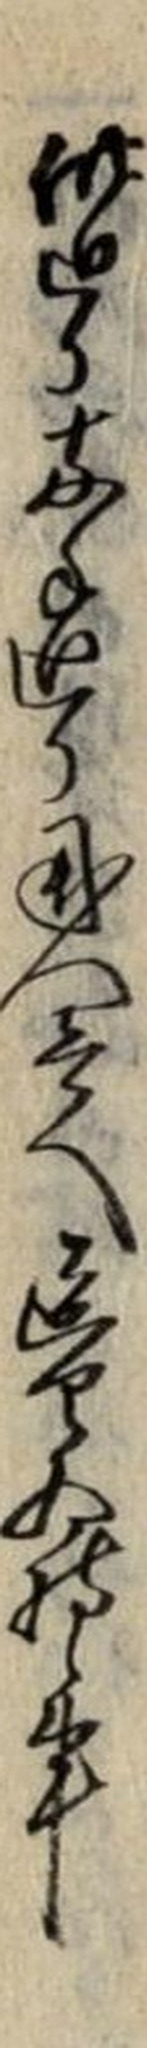供廻り両手廻り用人壱人道具為持候事
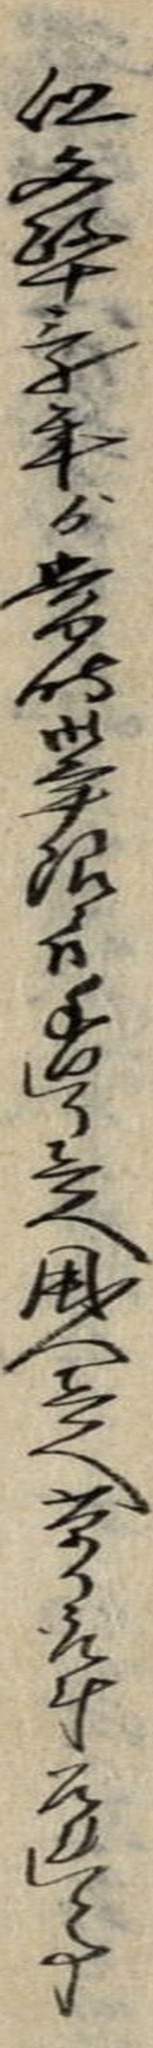但文政十三寅年ゟ当時御年始に付手廻り壱人用人壱人草り取斗召連候事
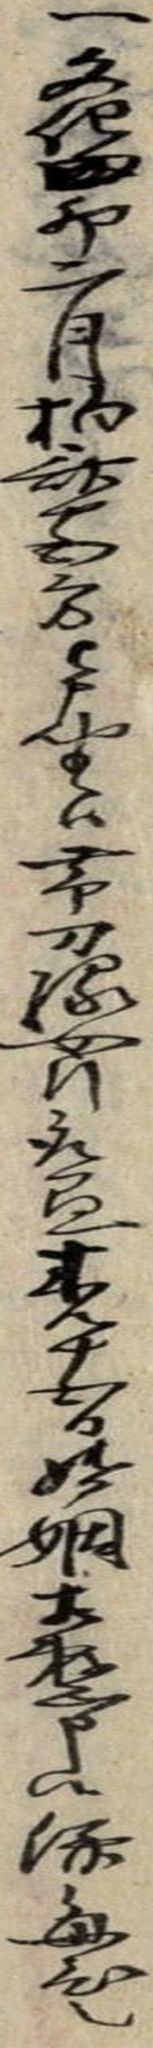一文化四卯二月狛斉宮方被申聞候は帯刀縁女引取置来る十五日婚姻相整申候併再度之
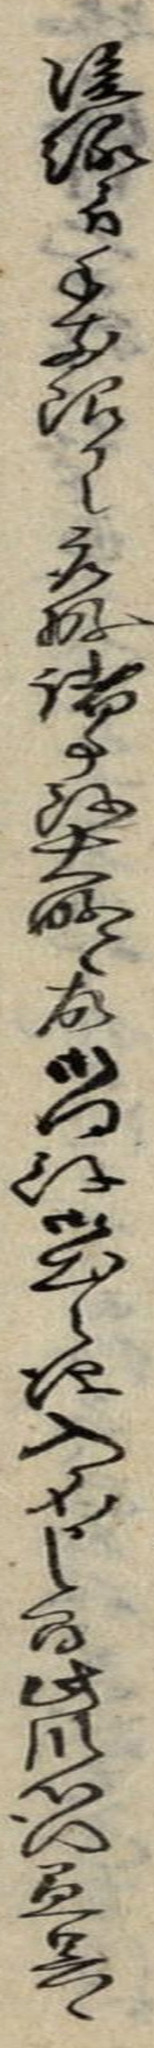後縁に付手前限り之取扱諸事致大略候故御同役御出之儀入不申候間此段心得置呉候
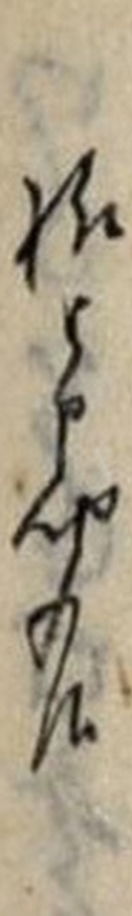様被申聞候
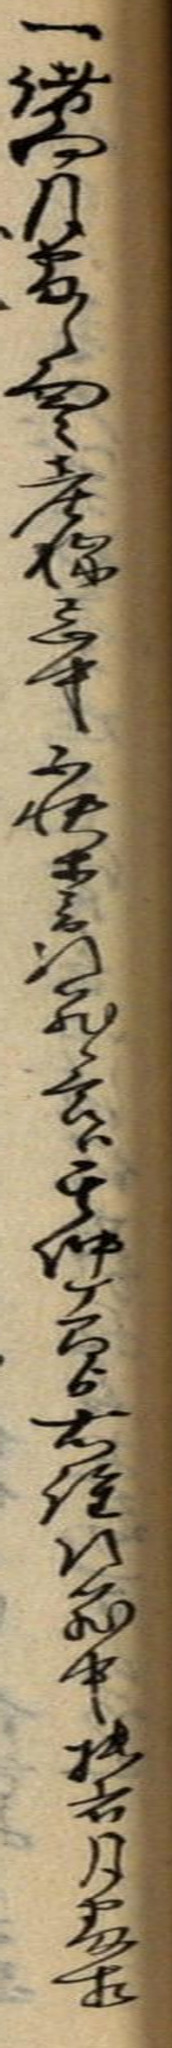一諸向月番之面々産穢忌中不快等に而引籠候節は其仲ヶ間ゟ右誰引籠中拙者月番相
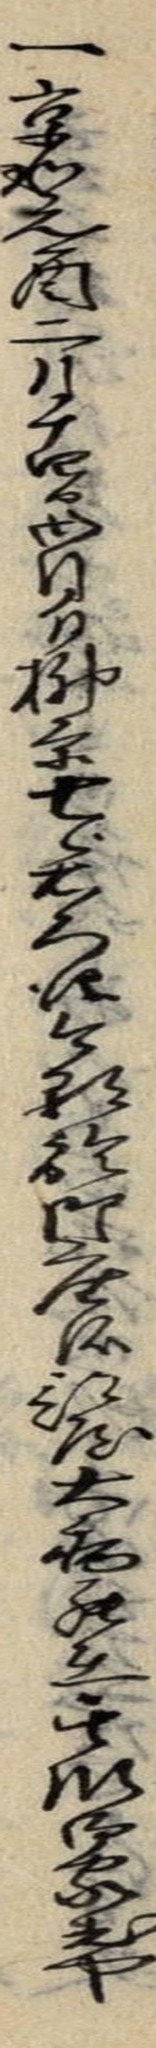一享和元酉二月十四日御目付榊原七郎右衛門儀今朝於御座所部屋大病罷在其段御家老中
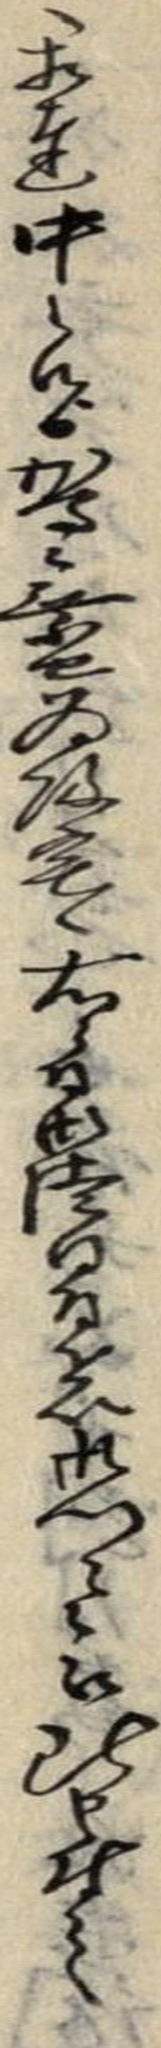へ相達中之口ゟ駕に乗せ為帰宅候右に付御徒目付を以御門〳〵江断申付之
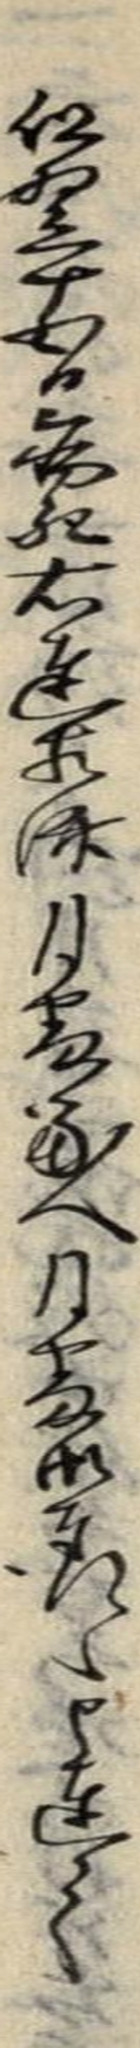但翌十五日病死右達相済月番御用人月番御奉行へ申達之
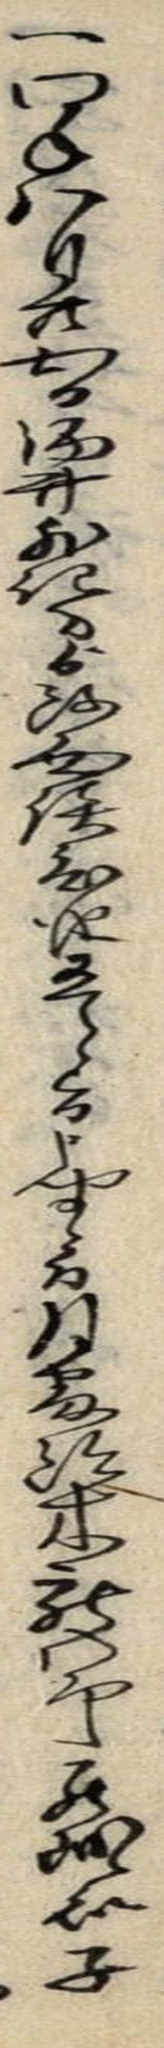一同年八月廿五日酒井外記方ゟ致面談度儀有之候旨申聞候に付月番鈴木新八郎罷越候処子
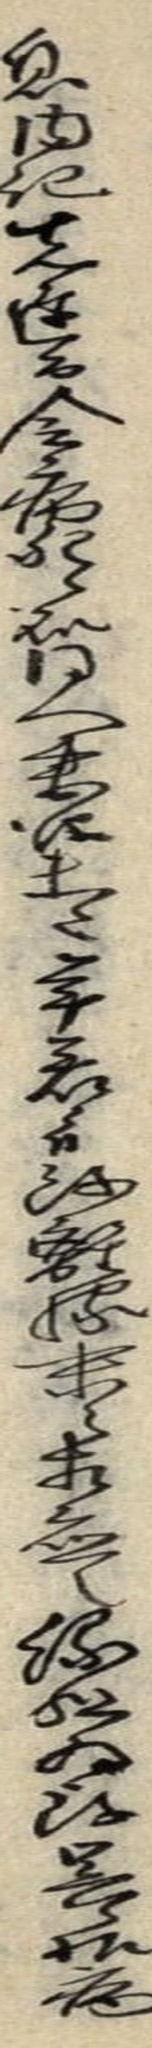息内記先達而令病死候処同人妻儀未た年若に付致離縁末々相応之縁組為致呉候様病
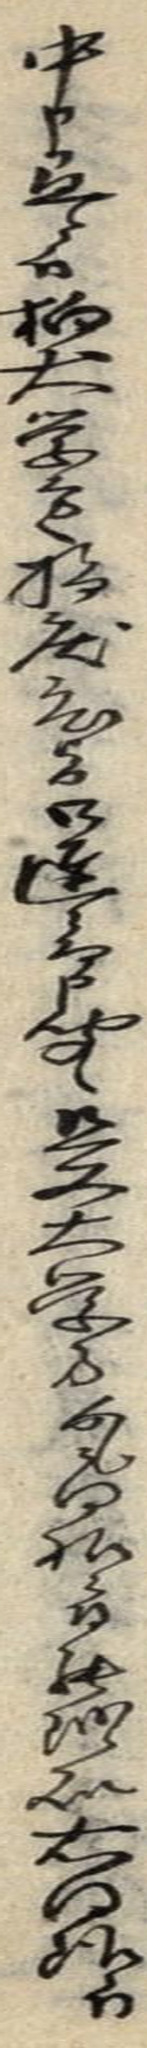中申置候に付狛大学方へ指戻度旨口達に而申聞候且又大学方ゟも同様に付罷越候処右同様に付
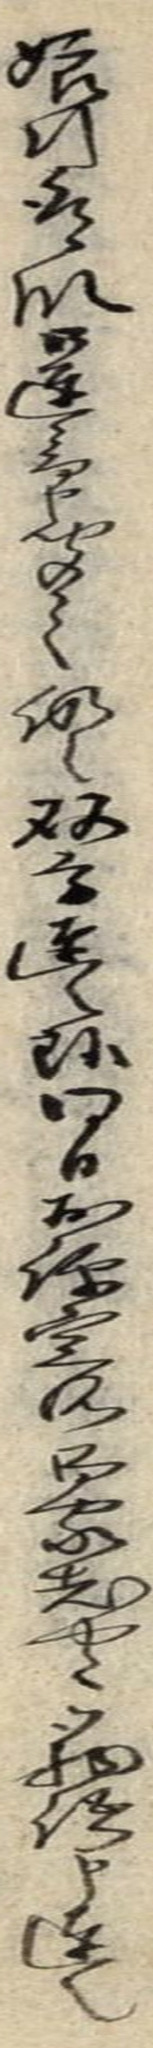娘引取候段口達に而申聞之仍之双方達之趣同日於評定所御家老中へ御物語申達之
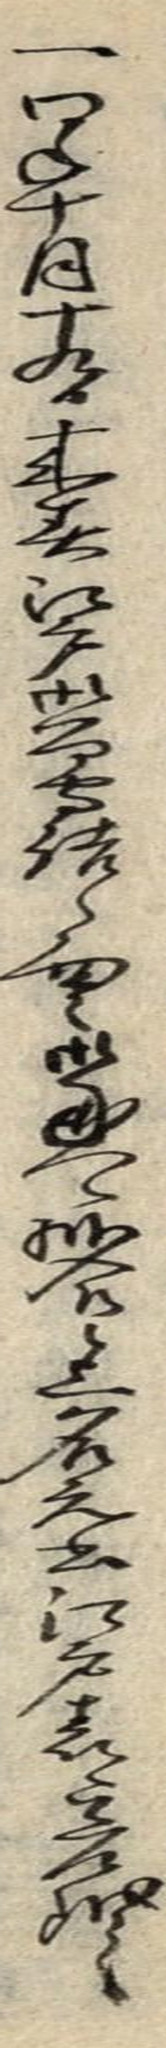一同年十月十九日來春江戸御留守詰之面々御用人へ掛合之上名元書江戸表へ差越之
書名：蒐輯之部
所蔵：福井県文書館 Fukui Prefectural Archives
